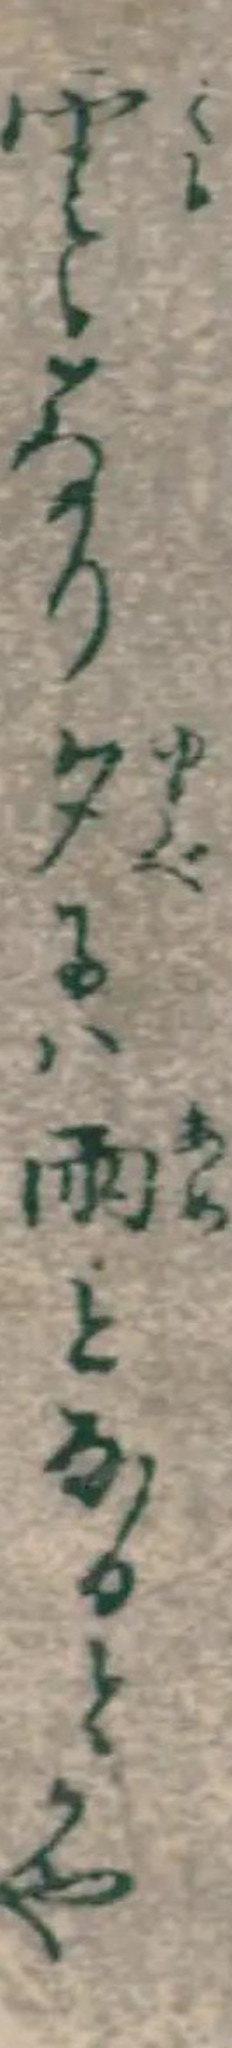雲となり夕には雨となるとかや
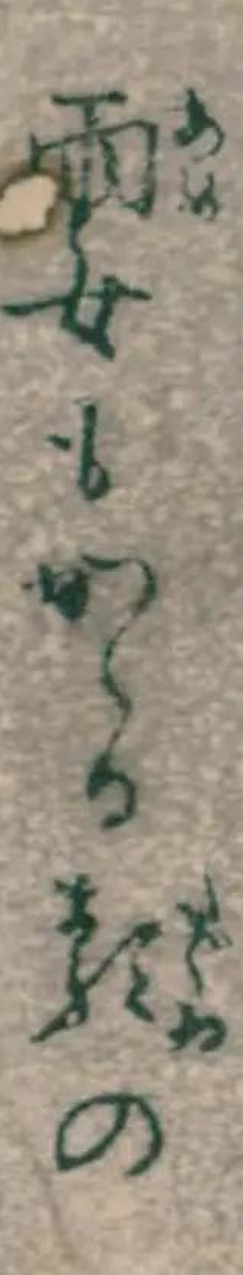雨女もかゝる類の
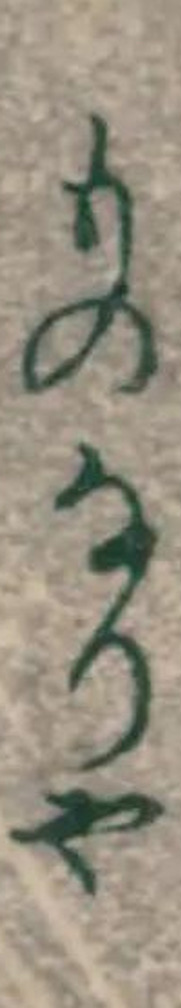ものなりや

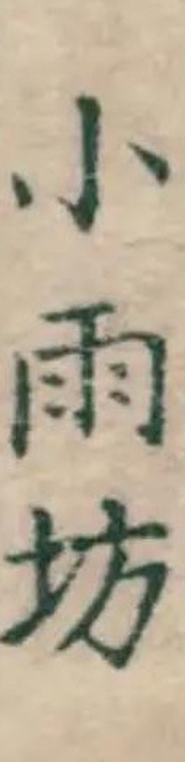小雨坊
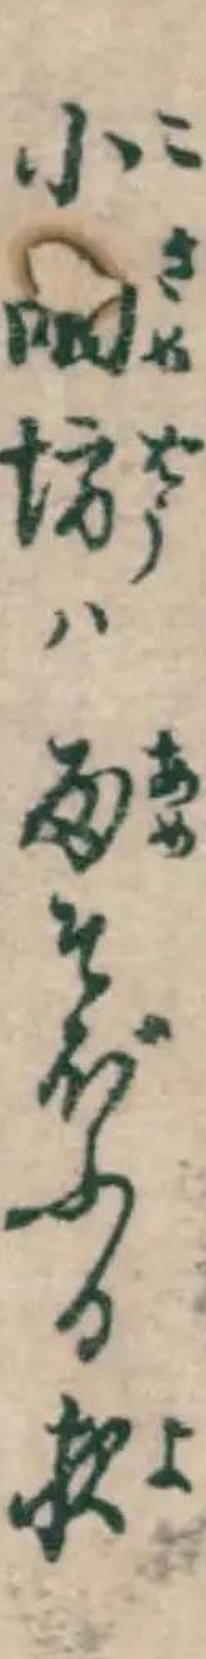小雨坊は雨そぼふる夜
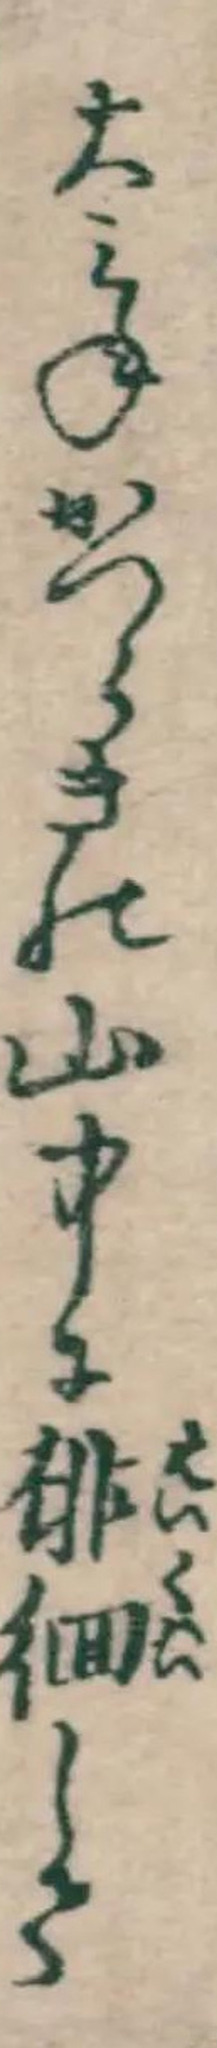大みねかつらきの山中に徘徊して
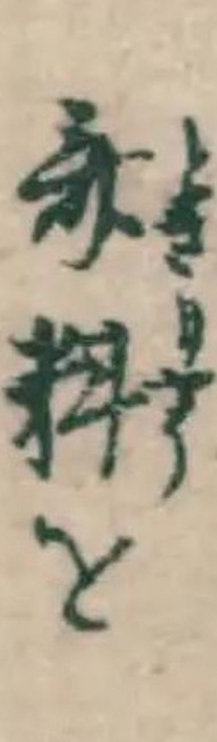斎料を
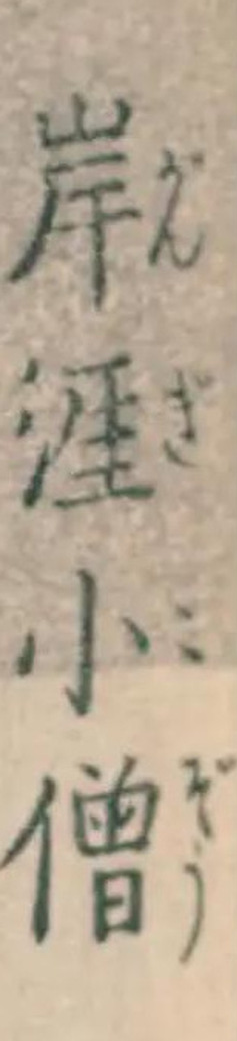岸涯小僧
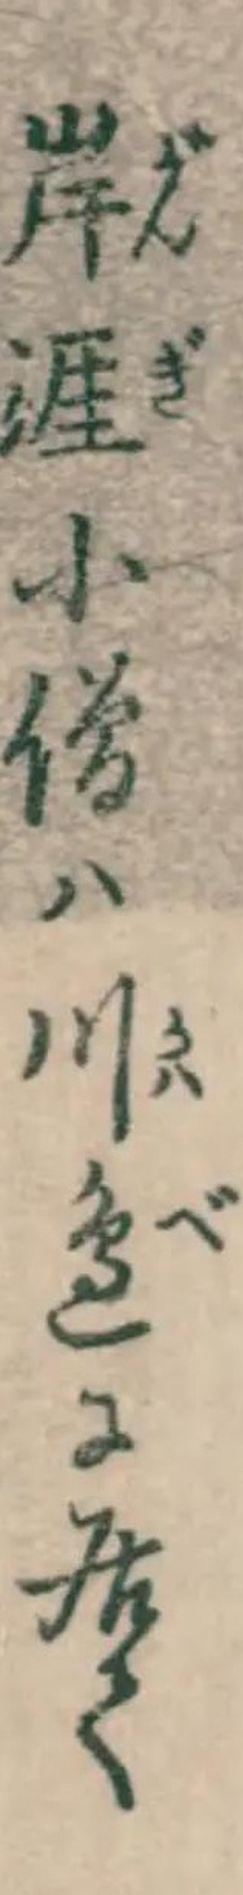岸涯小僧は川辺に居て
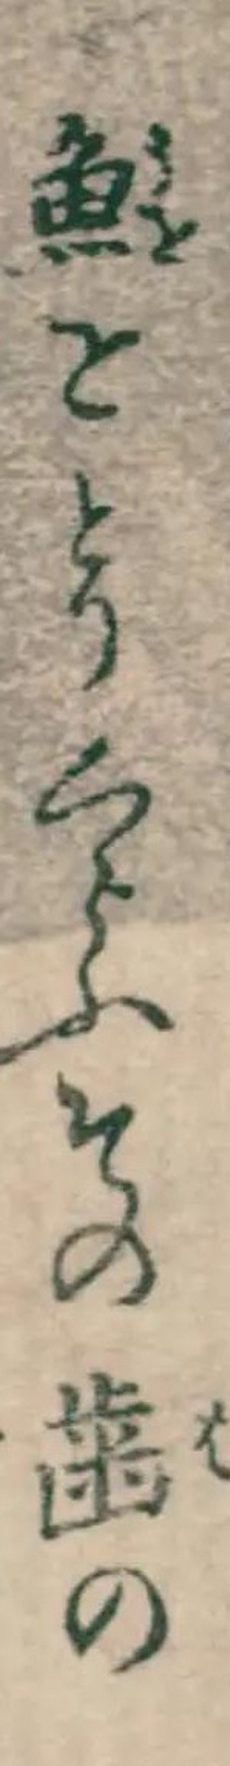魚をとりくらふその歯の
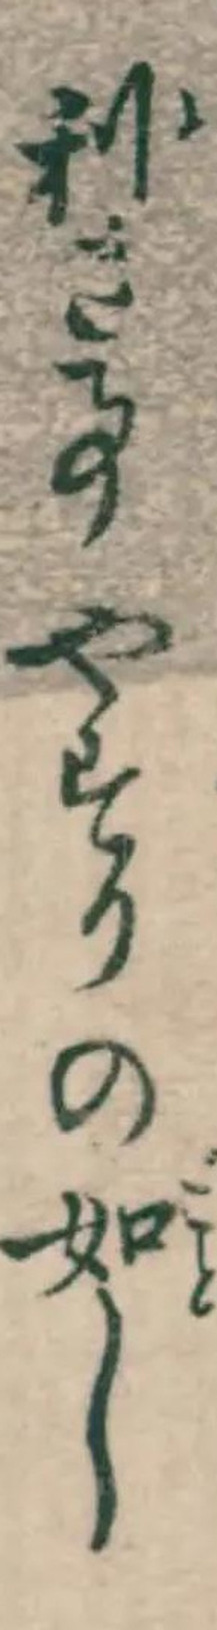利き事やすりの如し

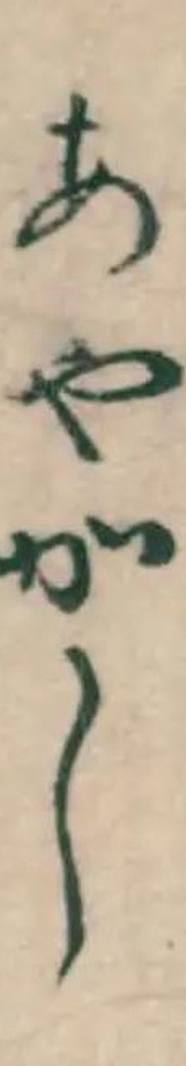あやかし
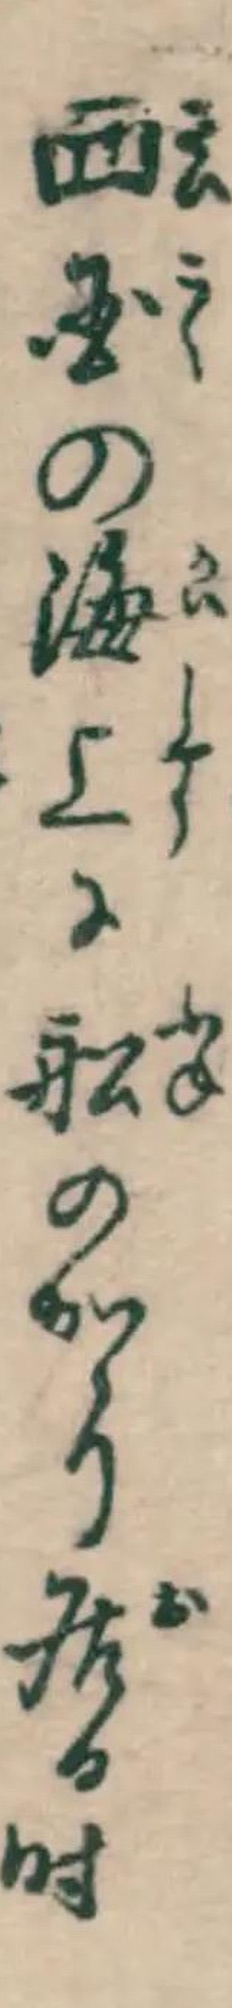西国の海上に船のかゝり居る時
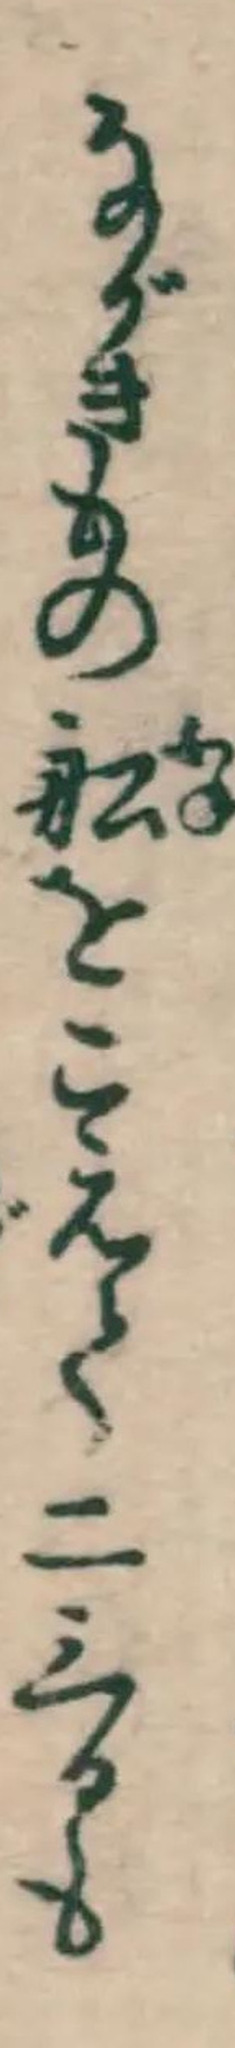ながきもの船をこえて二三日も
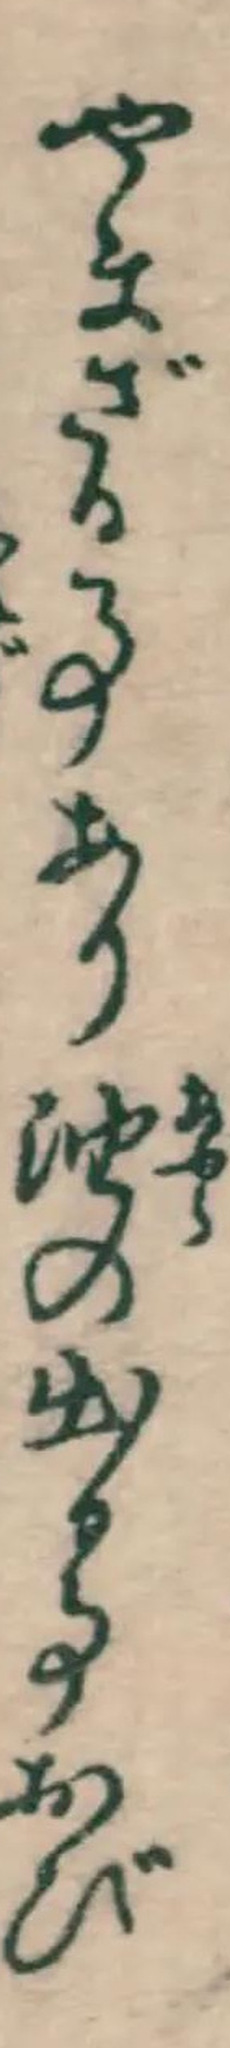やまざる事あり油の出る事おび
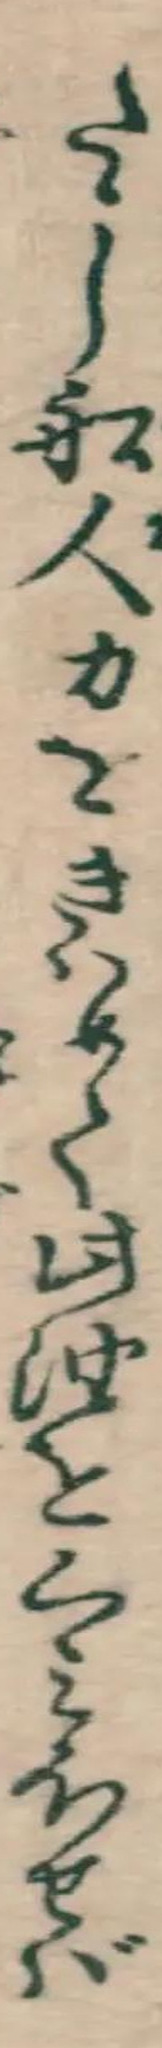たゝし船人力をきはめて此油をくみほせば
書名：百鬼夜行 3巻拾遺3巻. [2]
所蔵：国立国会図書館 National Diet Library, JAPAN
